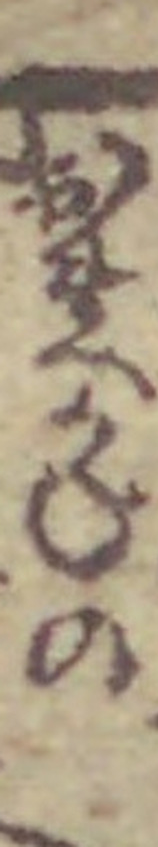おまへかねの
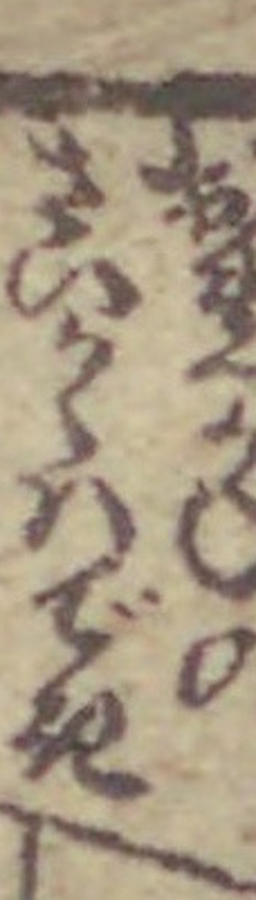さいくはでき
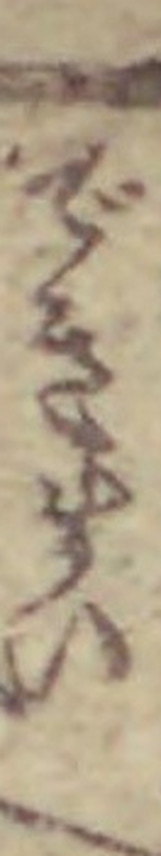できまい
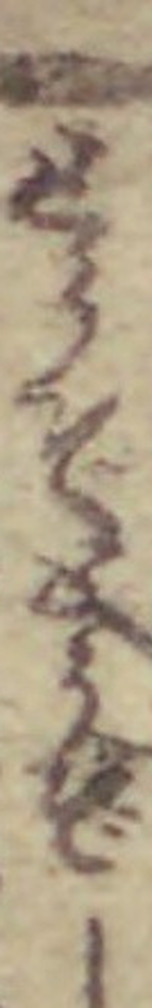とうそとうぞ
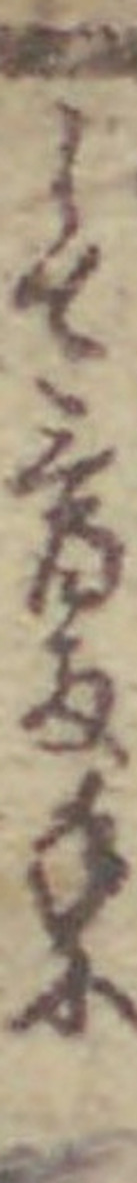して三百両手に
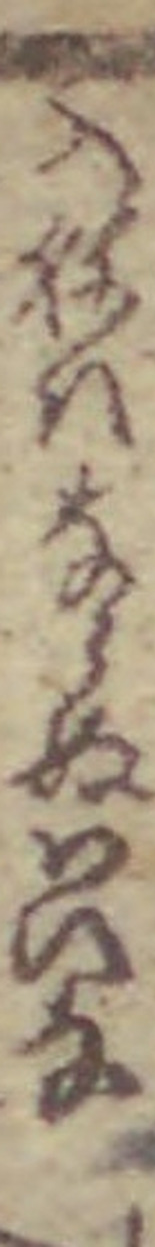入ねばならぬはいな
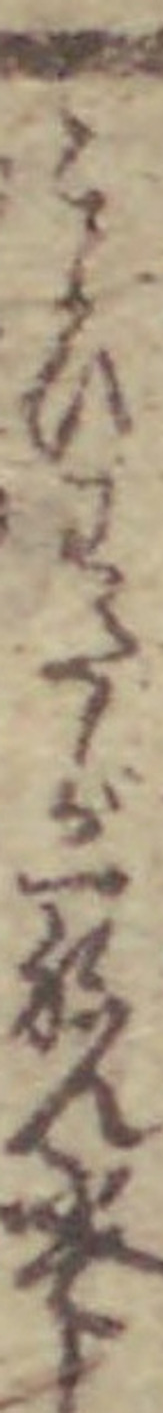こよひわたしが一ねんにて
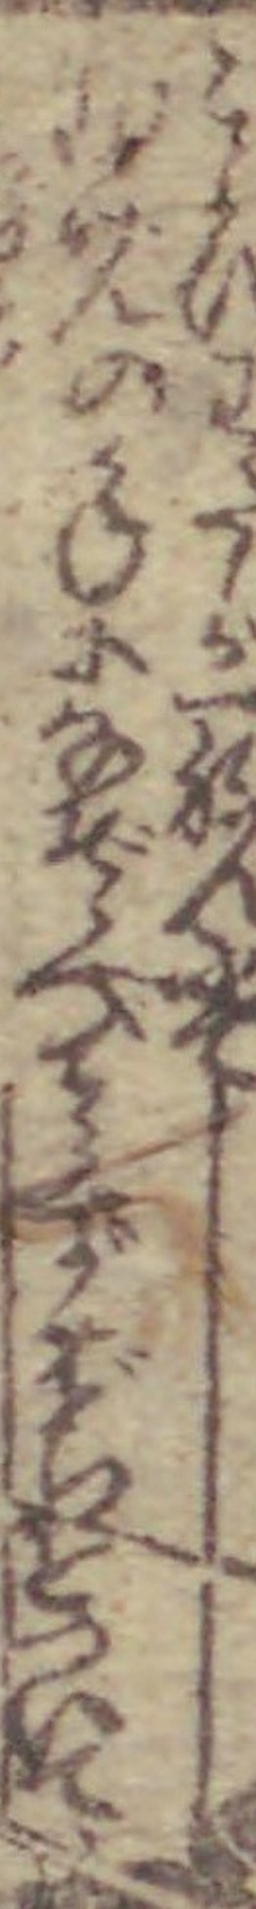むけんのかねになぞらへてうずばちをついて

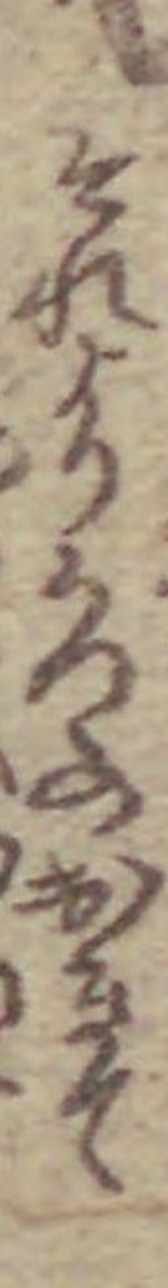それよりかつ山おきて
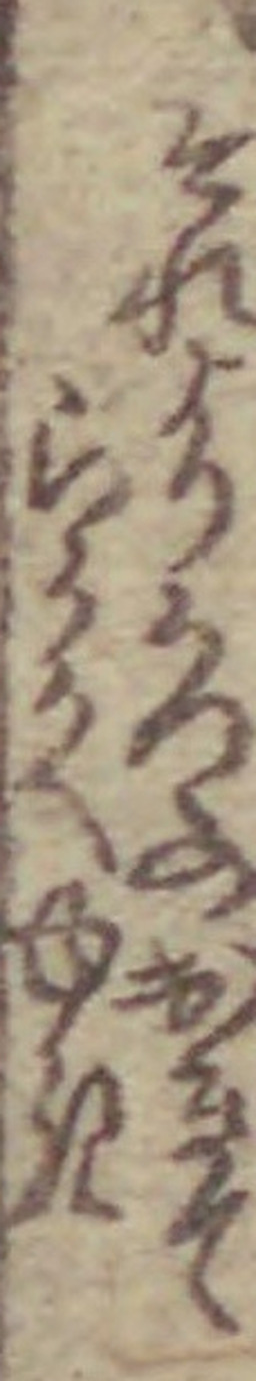らうかへゆき
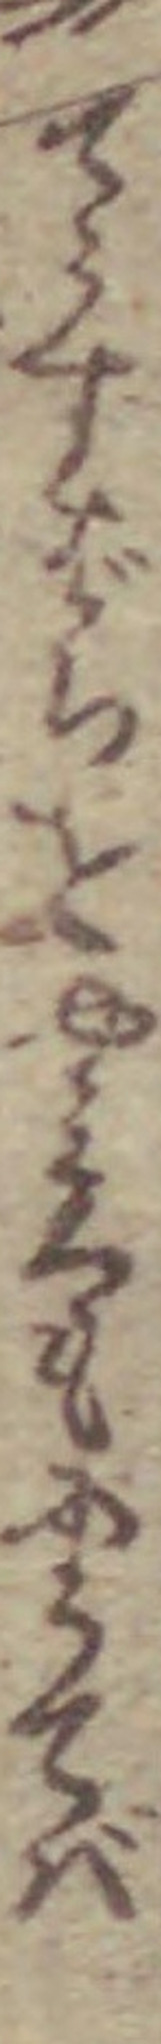てうずばちをやみくもにうてば
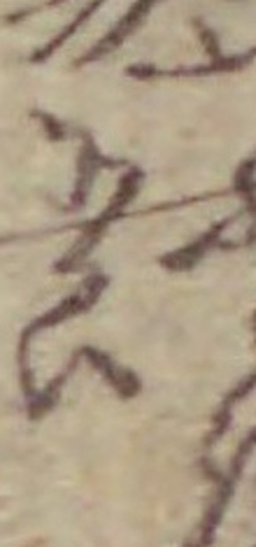にかい
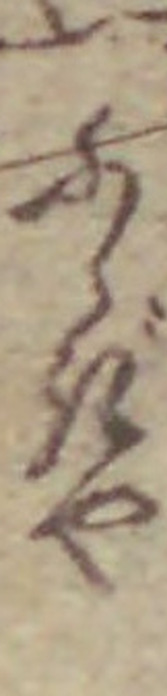ふしぎや
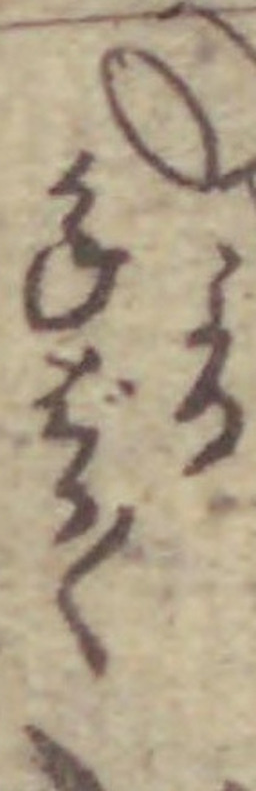かねばか〳〵
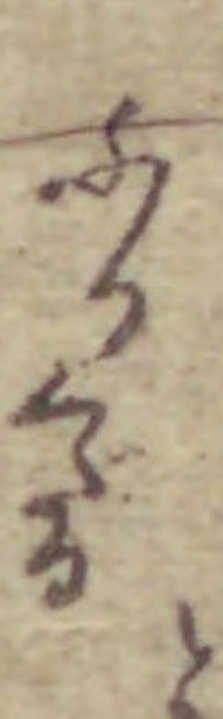ふりくだる
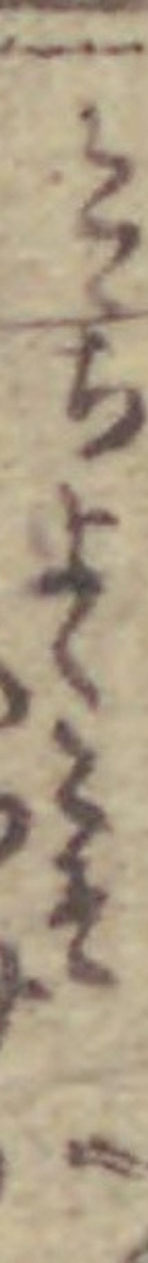こゝちよくこそ
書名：大通其面影 2巻
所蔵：国立国会図書館 National Diet Library, JAPAN
